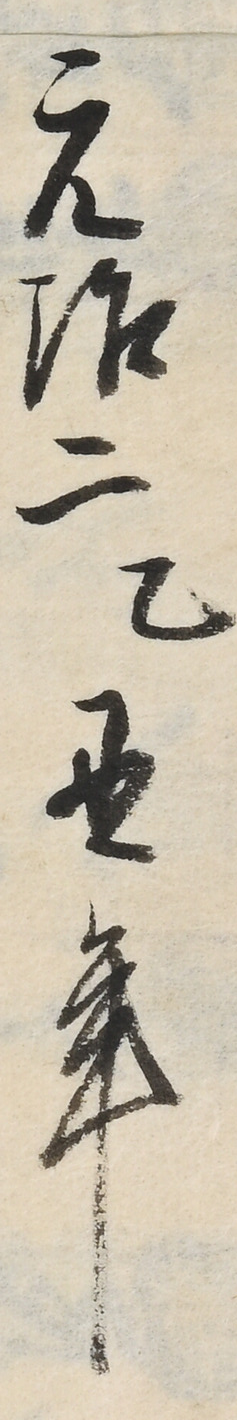元治二乙丑年
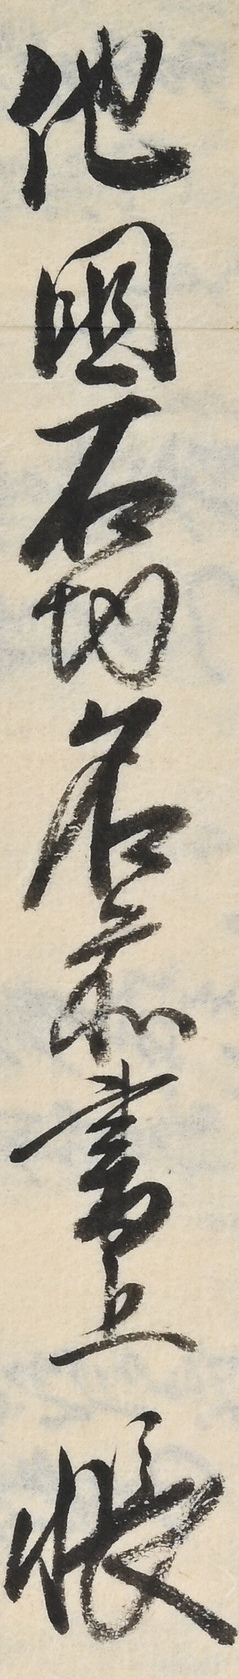他国石切名前書上帳
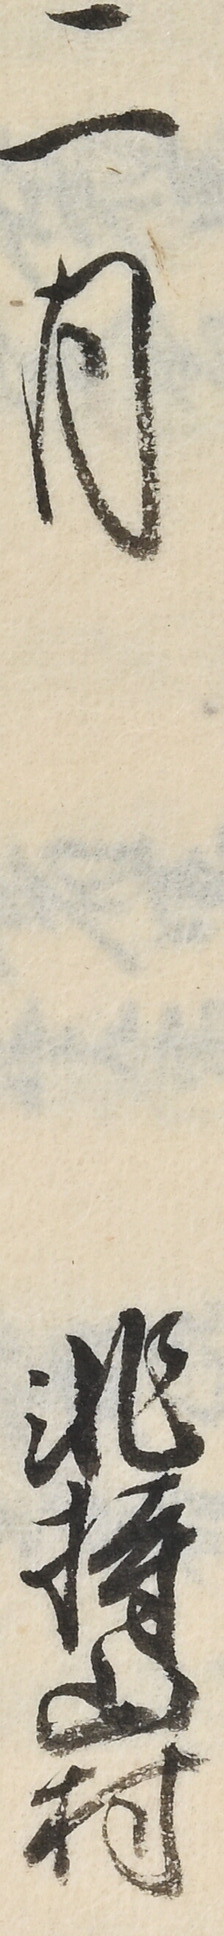二月非持山村

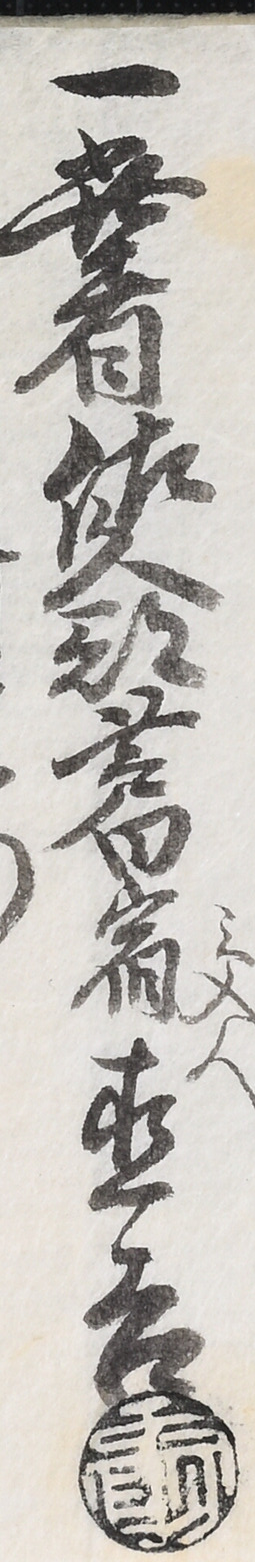一此者佐久郡芦田宿直吉(印)
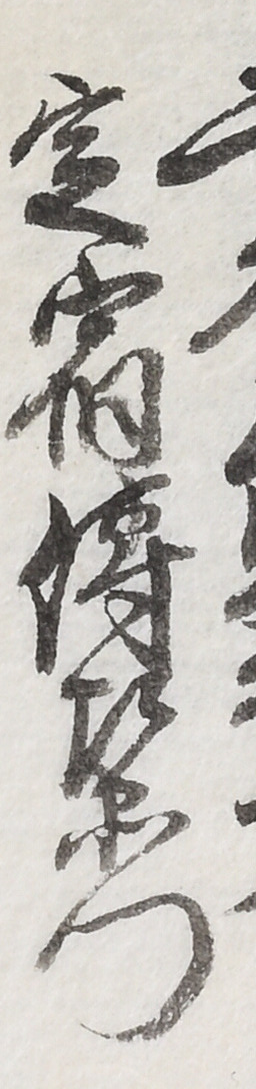定宿伝左衛門
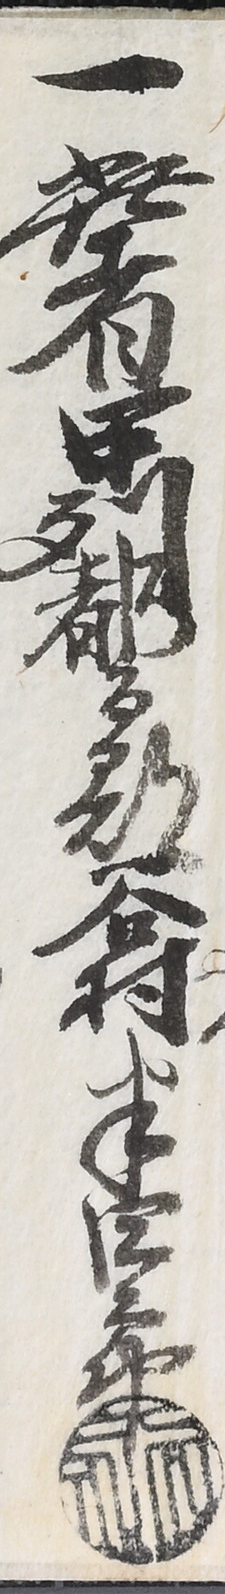一此者甲州都留郡谷村半四郎(印)
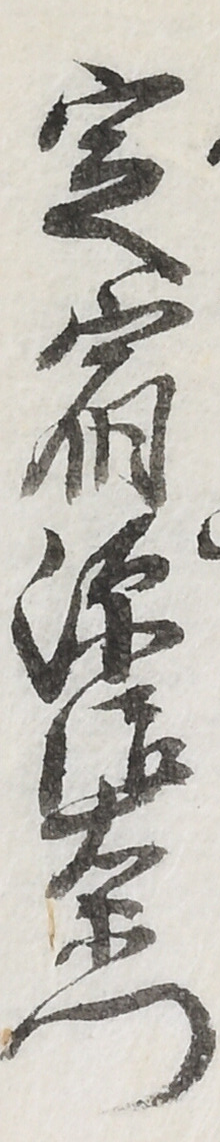定宿源治右衛門
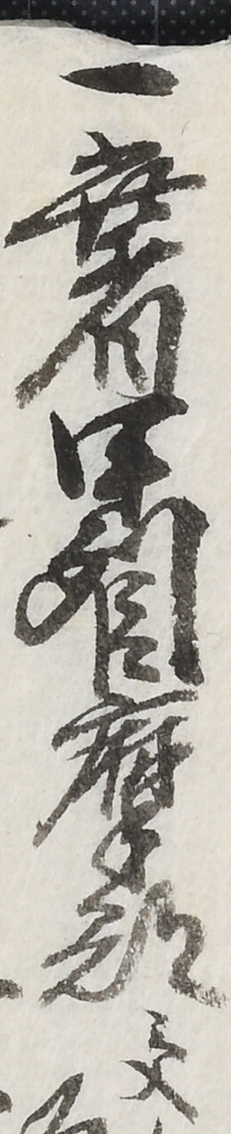一此者甲州巨摩郡受人
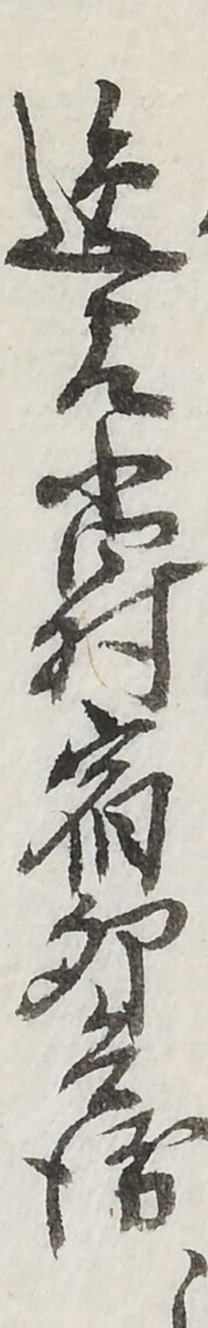逸見小田村宿卯兵衛
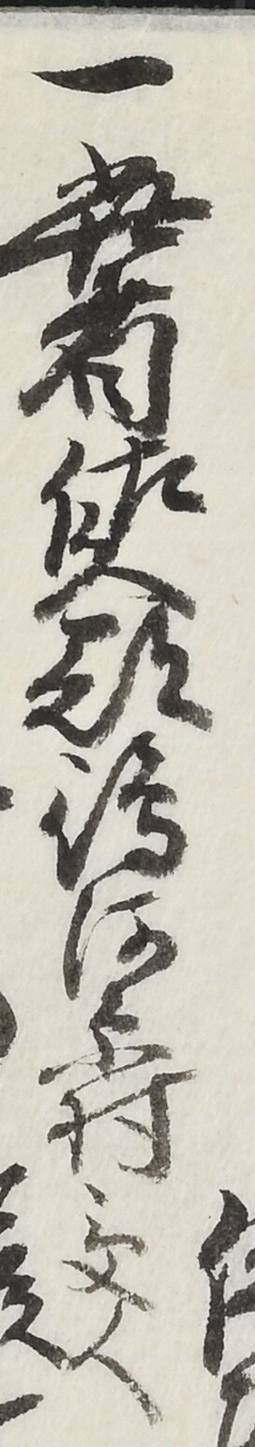一此者佐久郡嶋河原村受人
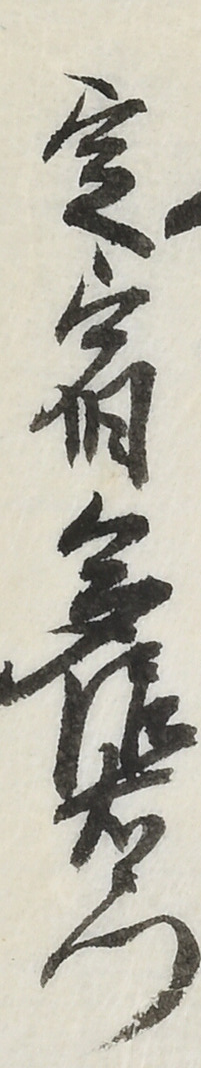定宿多治右衛門
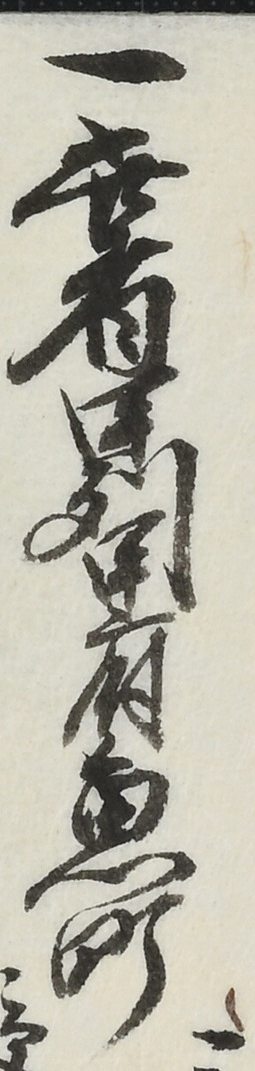一此者甲州甲府魚町

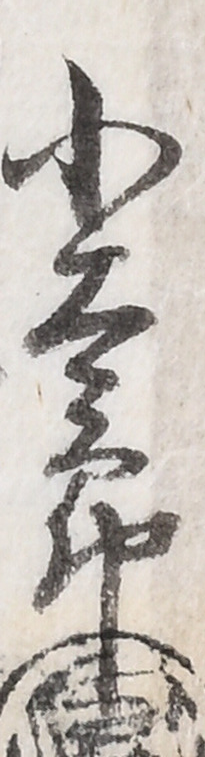小太郎(印)
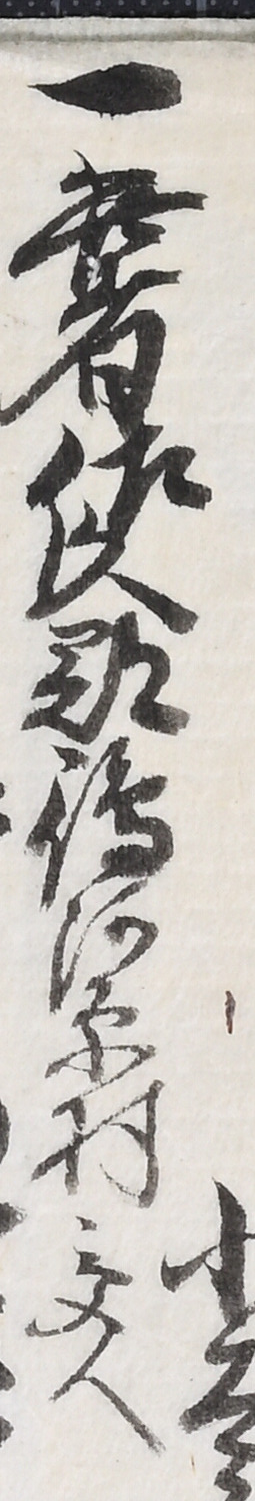一此者佐久郡嶋河原村受人
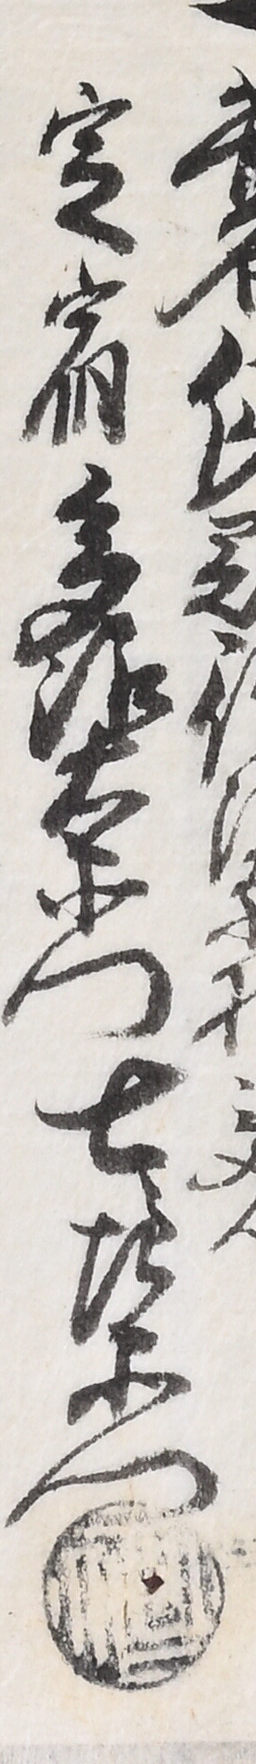定宿多治右衛門七郎左衛門(印)
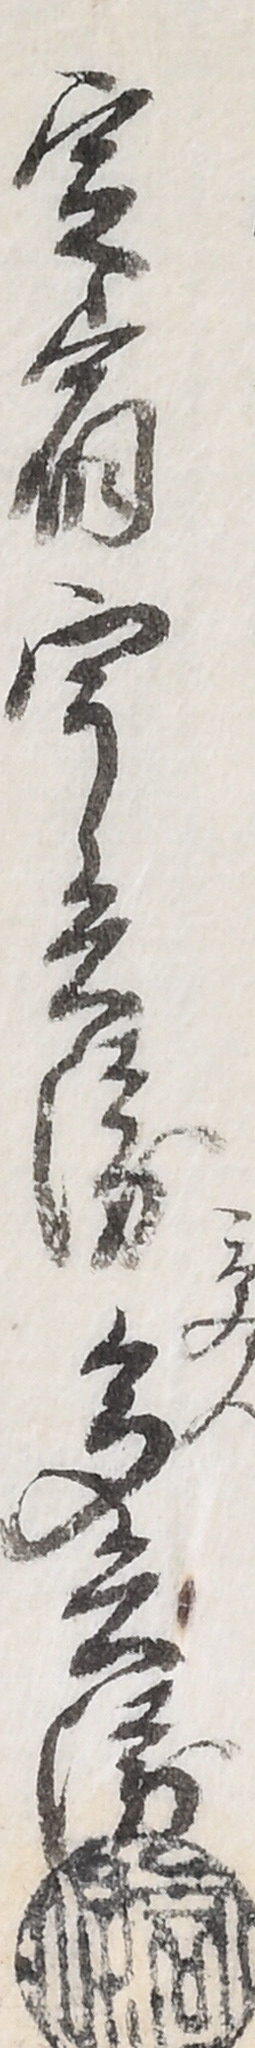定宿宇兵衛多兵衛(印)
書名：元治二乙丑年二月他國石切名前書上帳
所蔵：伊那市立高遠町図書館・合同会社AMANE
